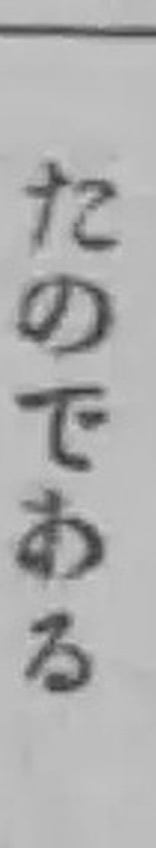たのである
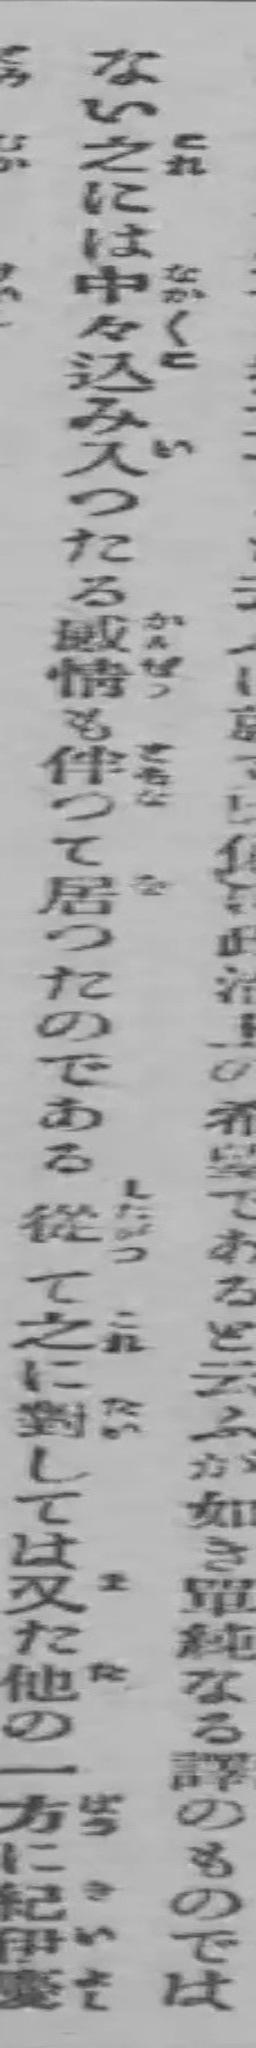ない之には中々込み入つたる感情も伴つて居つたのである従て之に対しては又た他の一方に紀伊慶
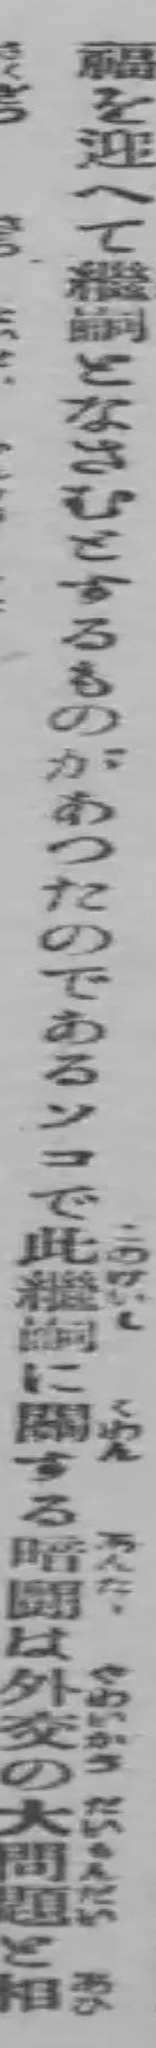福を迎へて継嗣となさむとするものがあつたのであるソコで此継嗣に関する暗闘は外交の大問題と相
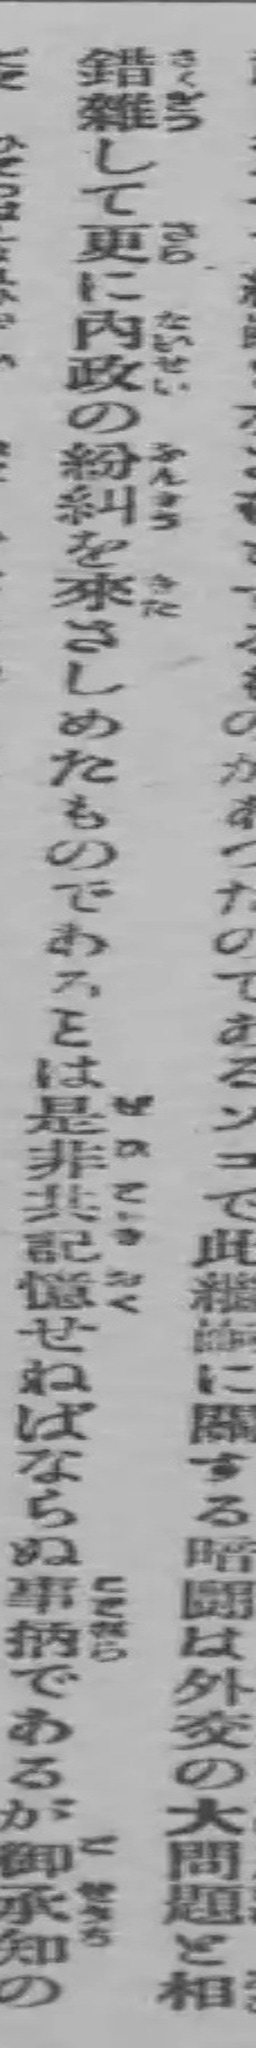錯雑して更に内政の紛糾を来さしめたものであることは是非共記憶せねばならぬ事柄であるが御承知の
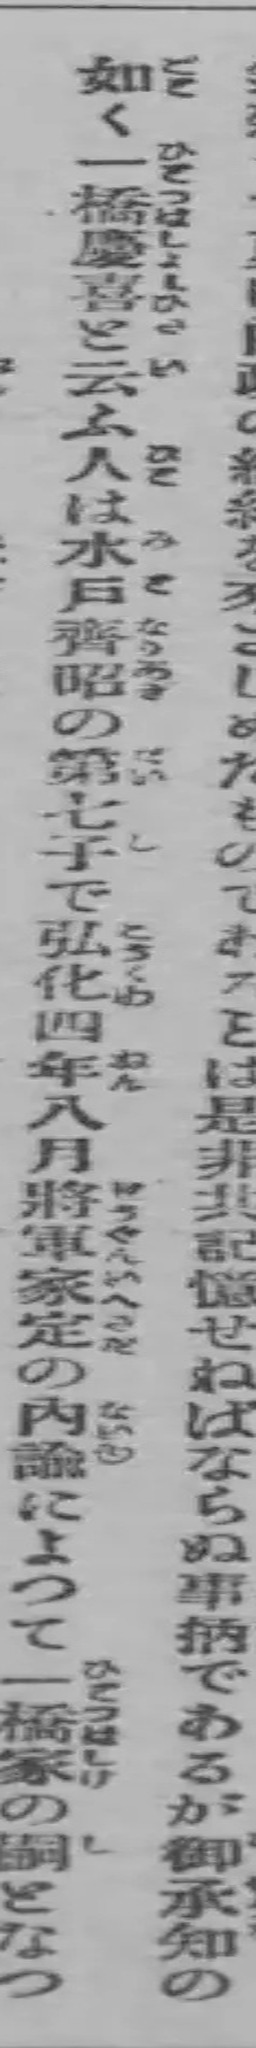如く一橋慶喜と云ふ人は水戸斉昭の第七子で弘化四年八月将軍家定の内諭によつて一橋家の嗣となつ
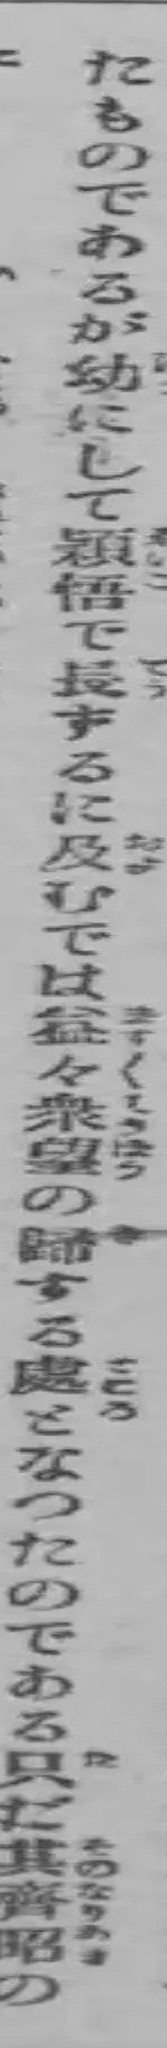たものであるが幼にして頴悟で長ずるに及むでは益々衆望の帰する処となつたのである只だ其斉昭の
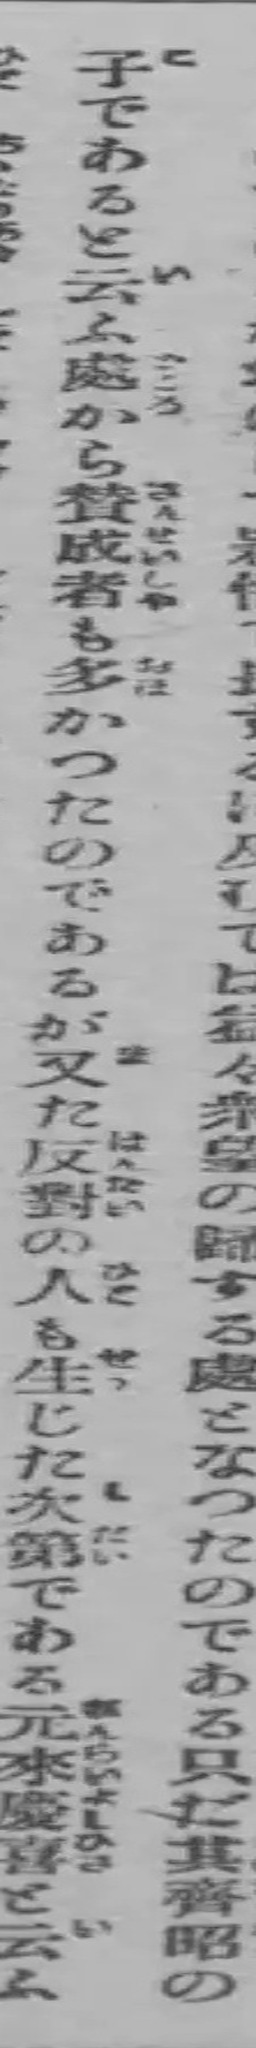子であると云ふ処から賛成者も多かつたのであるが又た反対の人も生じた次第である元来慶喜と云ふ
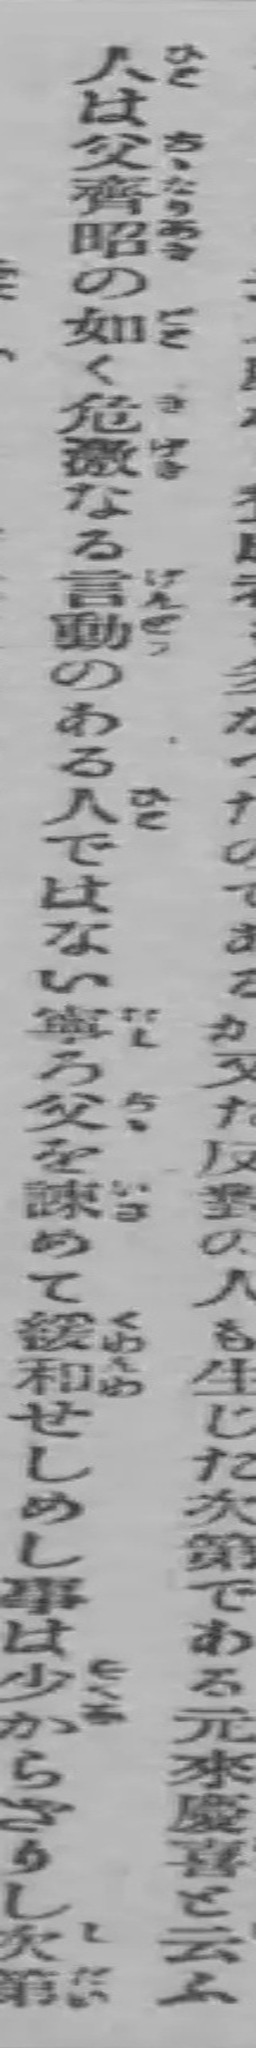人は父斉昭の如く危激なる言動のある人ではない寧ろ父を諌めて緩和せしめし事は少からざりし次第
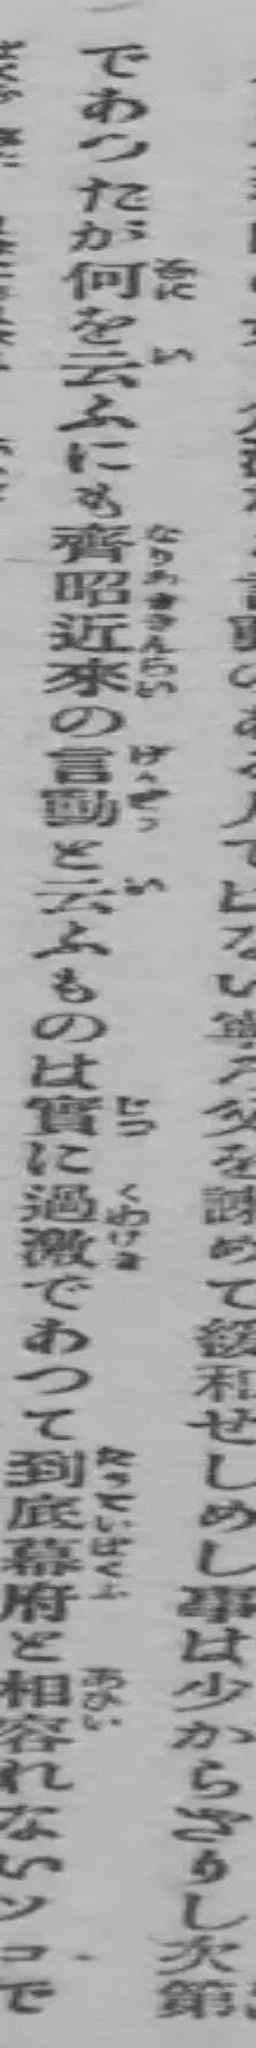であつたが何を云ふにも斉昭近来の言動と云ふものは実に過激であつて到底幕府と相容れないソコで
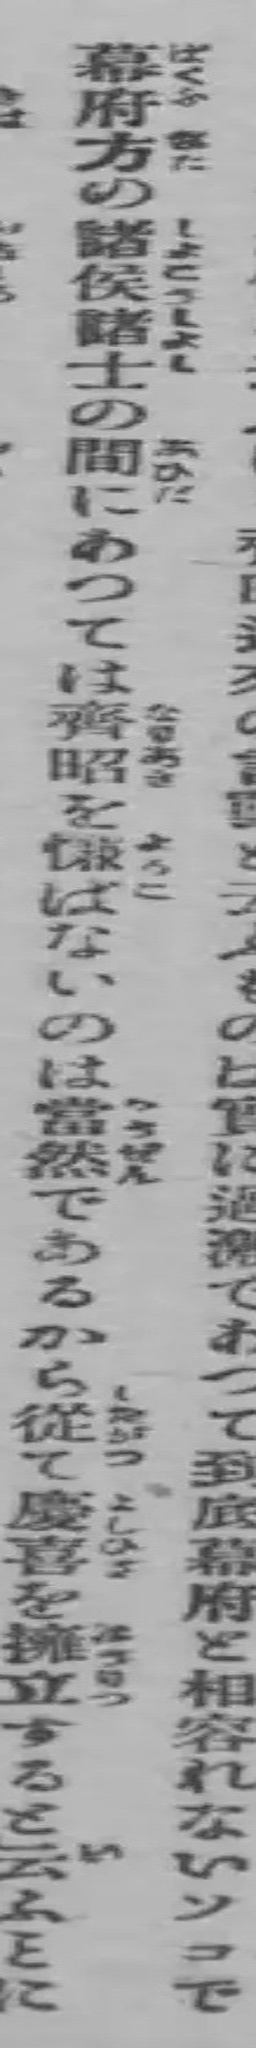幕府方の諸侯諸士の間にあつては斉昭を慊ばないのは当然であるから従て慶喜を擁立すると云ふことに
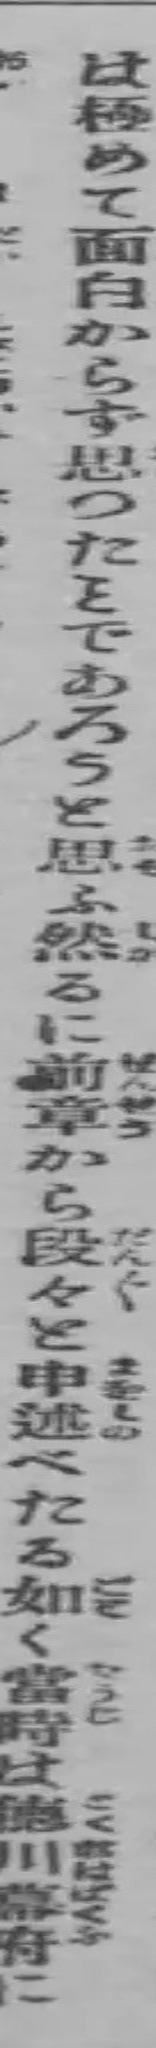は極めて面白からず思つたことであろうと思ふ然るに前章から段々と申述べたる如く当時は徳川幕府に
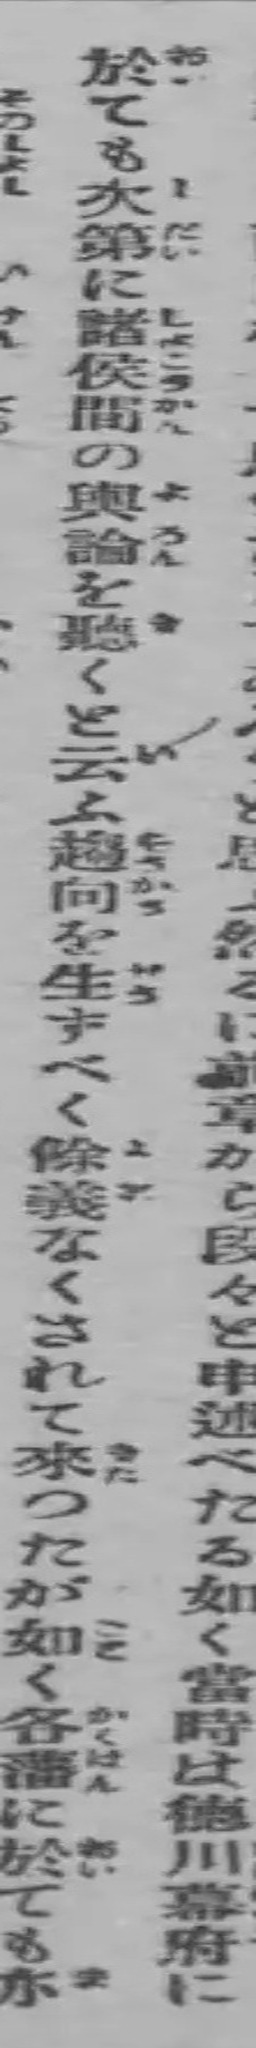於ても次第に諸侯間の輿論を聴くと云ふ趣向を生ずべく余義なくされて来つたが如く各藩に於ても亦
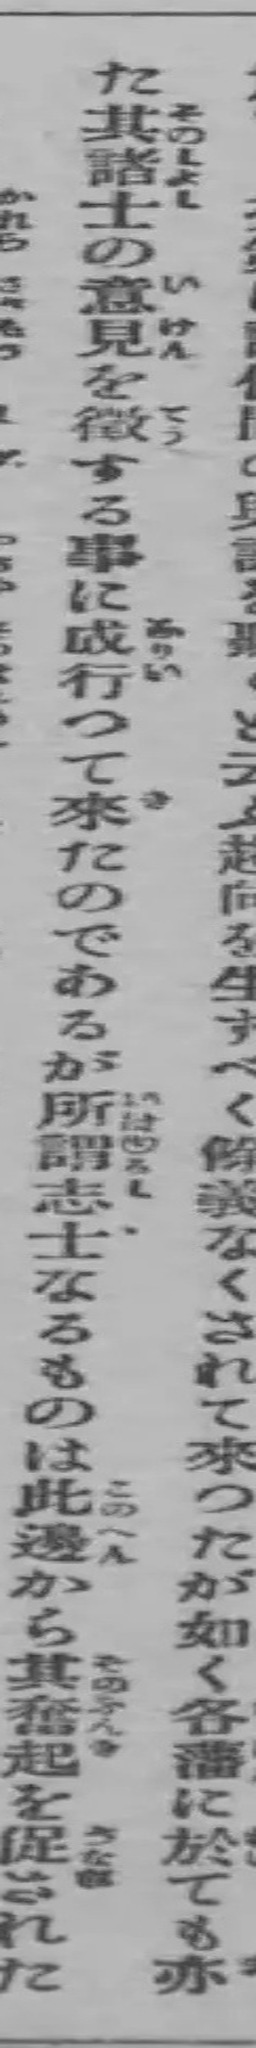た其諸士の意見を徴する事に成行つて来たのであるが所謂志士なるものは此辺から其奮起を促された
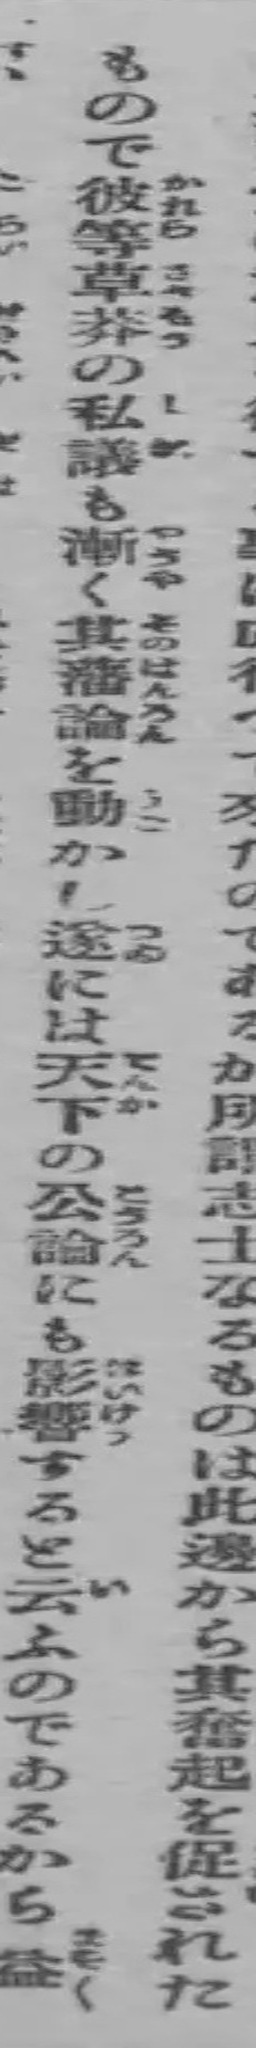もので彼等草莽の始議も漸く其藩論を動かし遂には天下の公論にも影響すると云ふのであるから益
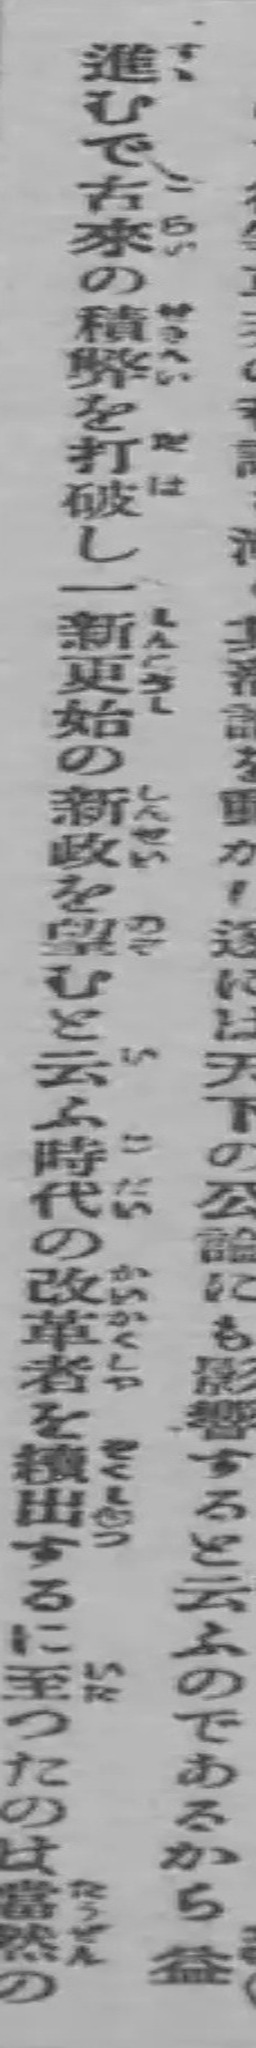進むで古来の積弊を打破し一新更始の新政を望むと云ふ時代の改革者を続出するに至つたのは当然の
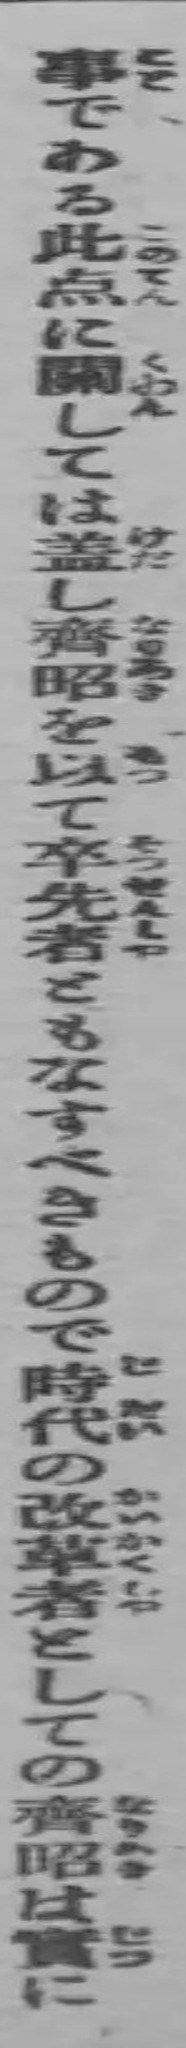事である此点に関しては蓋し斉昭を以て率先者ともなすべきもので時代の改革者としての斉昭は実に
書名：豊橋市史談
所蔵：国立国会図書館 National Diet Library, JAPAN
